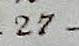27
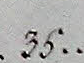35
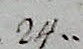24
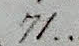71
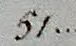51
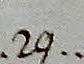29
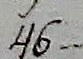46
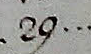29
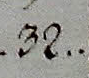32
